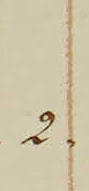2
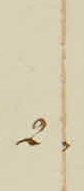2
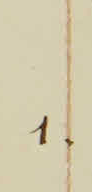1
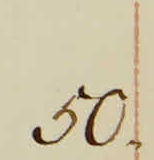50
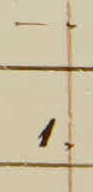1
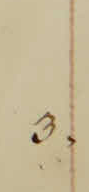3
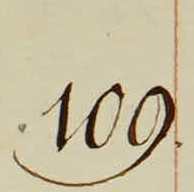109
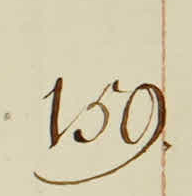159.
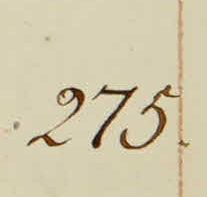275.
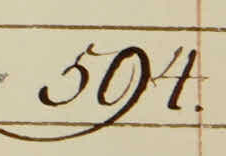594.
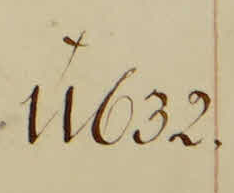11632
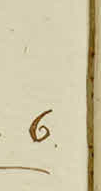6.
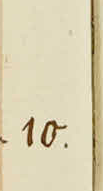10.
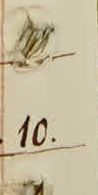10.
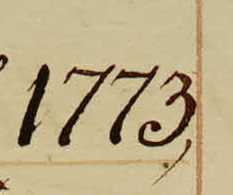1773,
